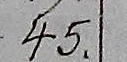45.
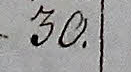30.
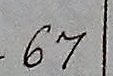67
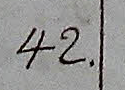42.
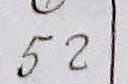52
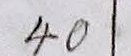40
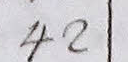42
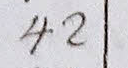42
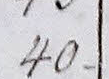40
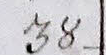38
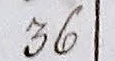36
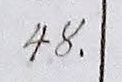48.
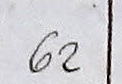62
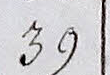39
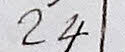24
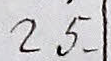25
